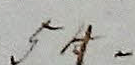54
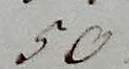50
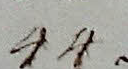44
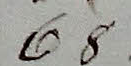68
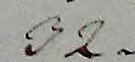32
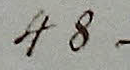48
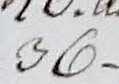36
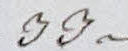33
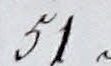51
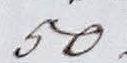50
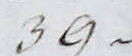39
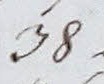38
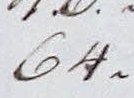64
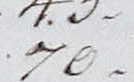70
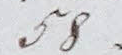58
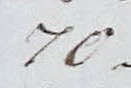70
